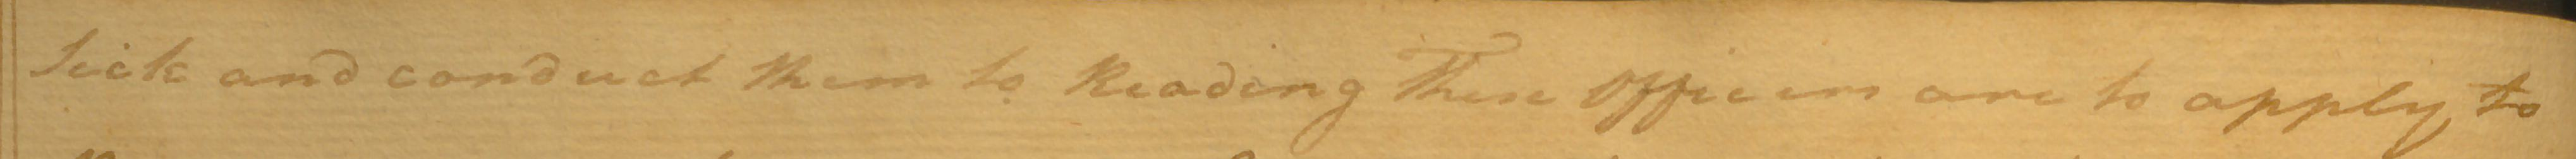sick and conduct them to Reading These officers are to apply to
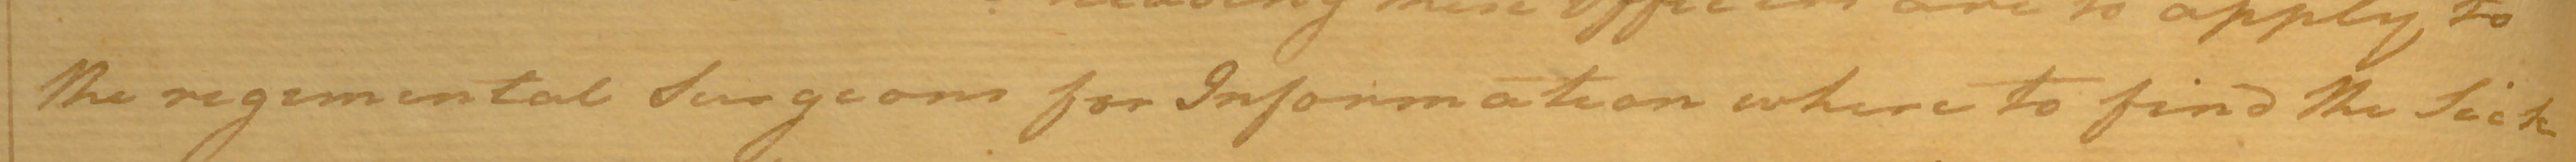the regemental Surgeons for Information where to find the Sick
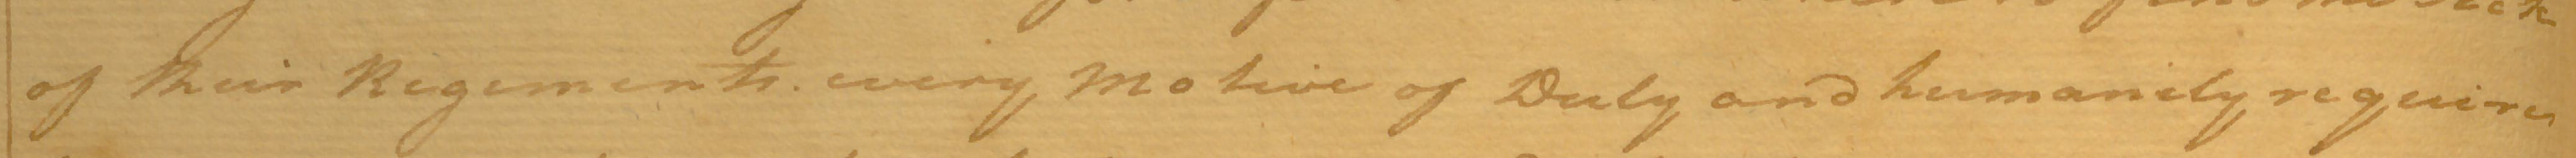of their Regiments every Motive of Duty and humanity require
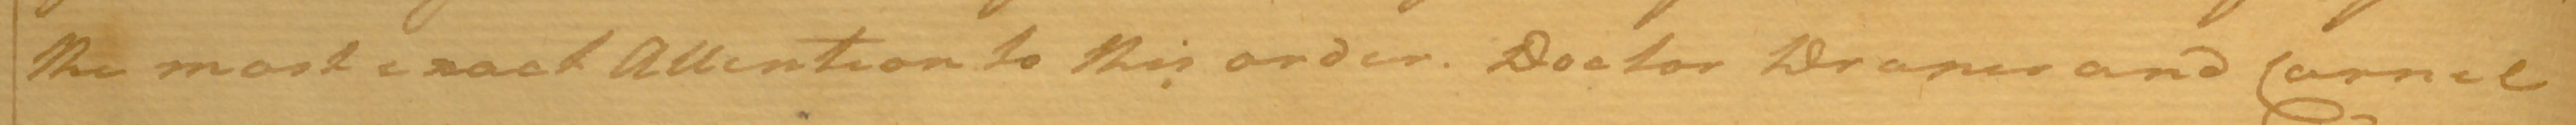the most exact Attention to this order. Doctor Draper and Carnel
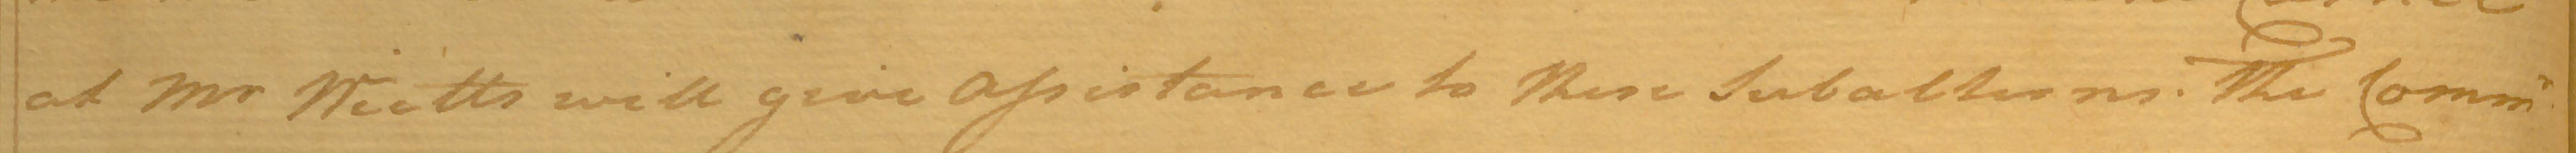at M^r Weets will give assistance to these subalterns. The Comm^r
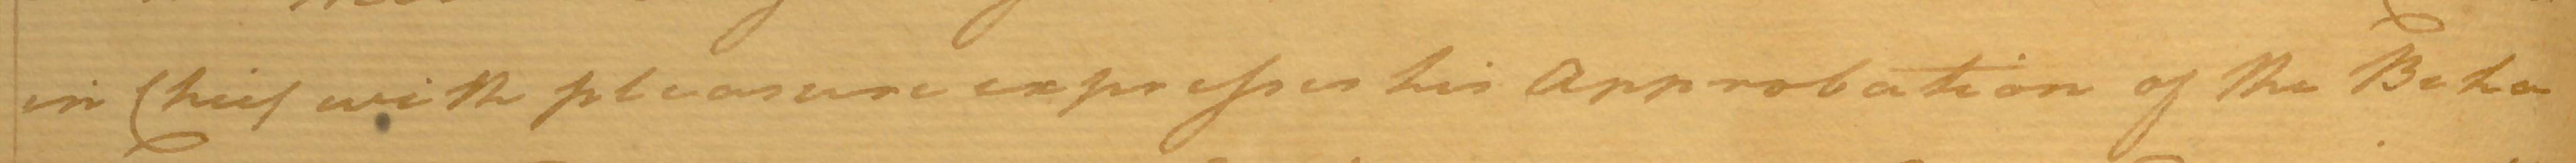in Chief with pleasure expresses his Approbation of the Beha
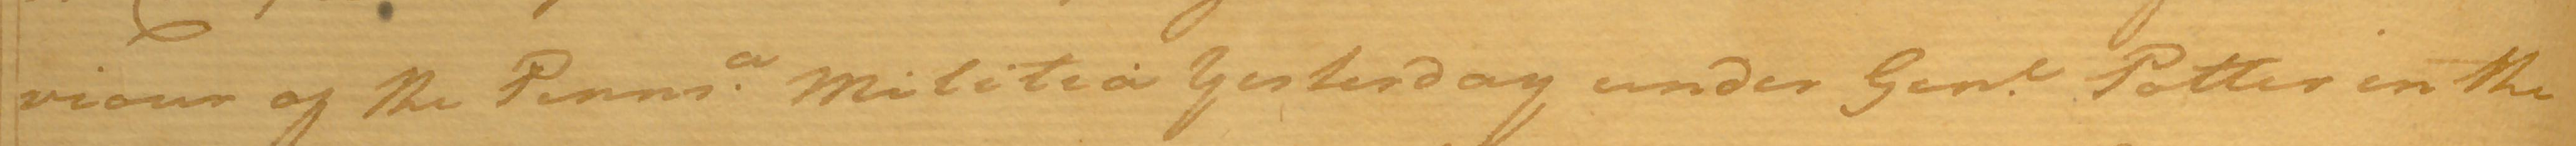viour of the Penns^a. Militia yesterday under Gen^l. Potter in the
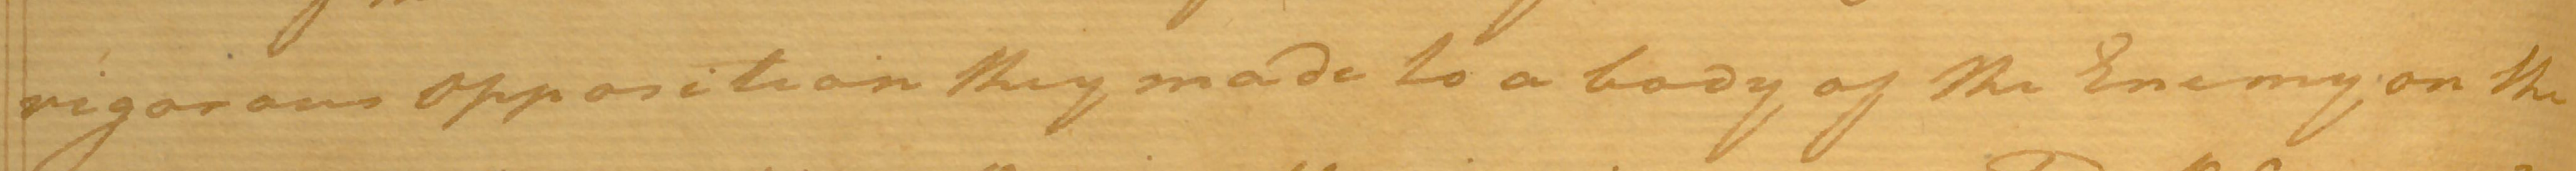vigorous opposition they made to a body of the Enemy on the
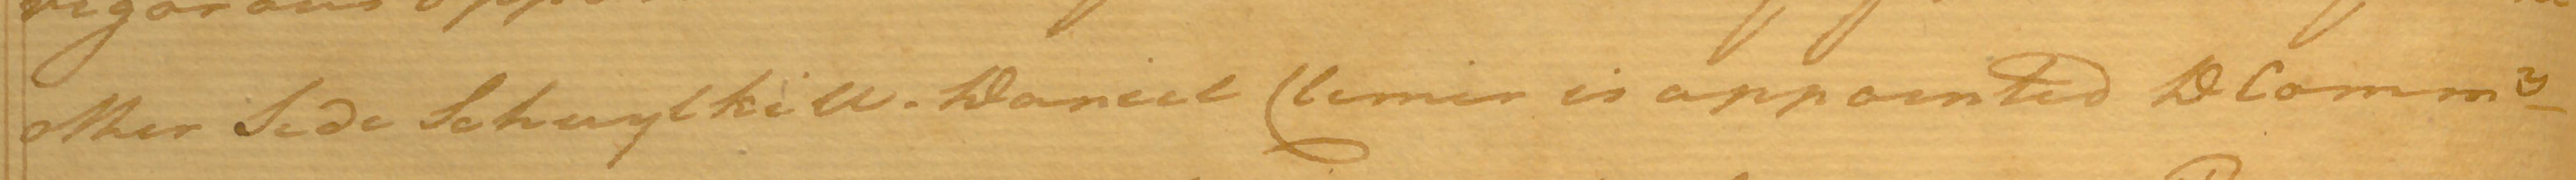other Side Schuylkill. Daniel Climer is appointed D Comm^y-
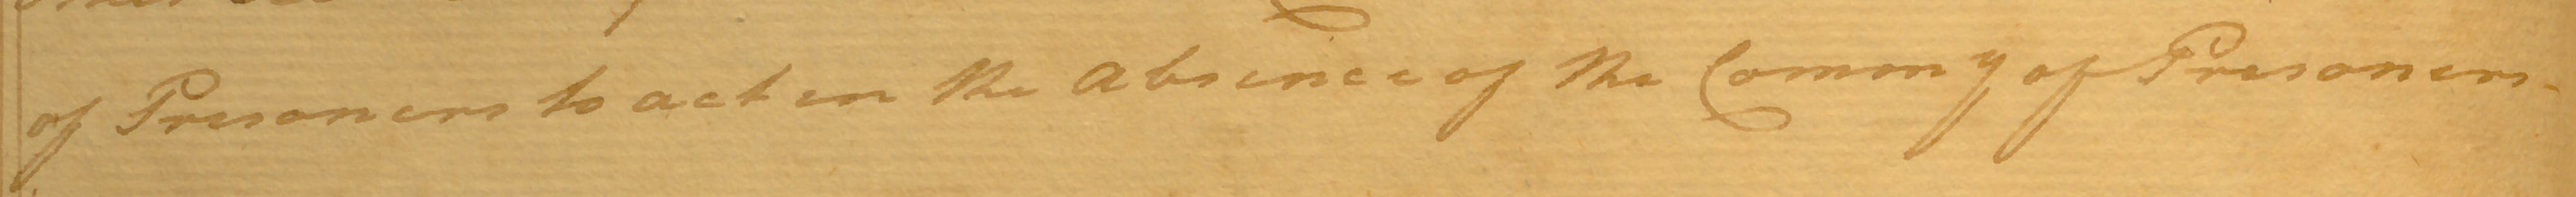of Prisoners to act in the absence of the Comm^y of Prisoners-
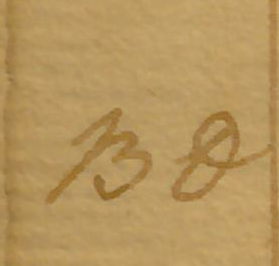BO
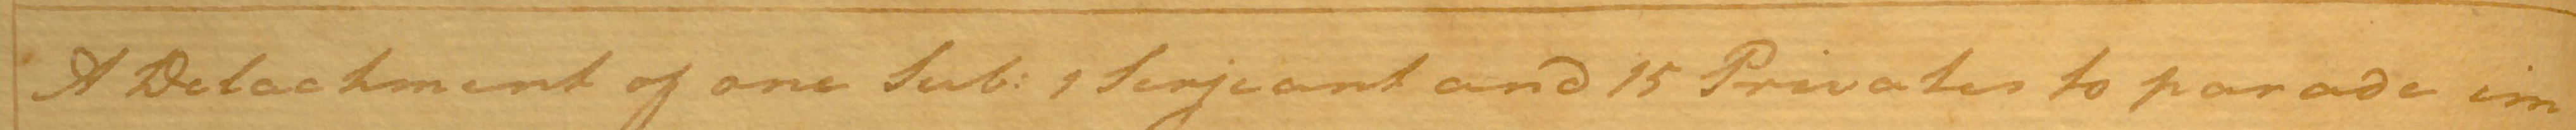A Declaration of one Sub: 1 Serjeant and 15 Privates to parade im
